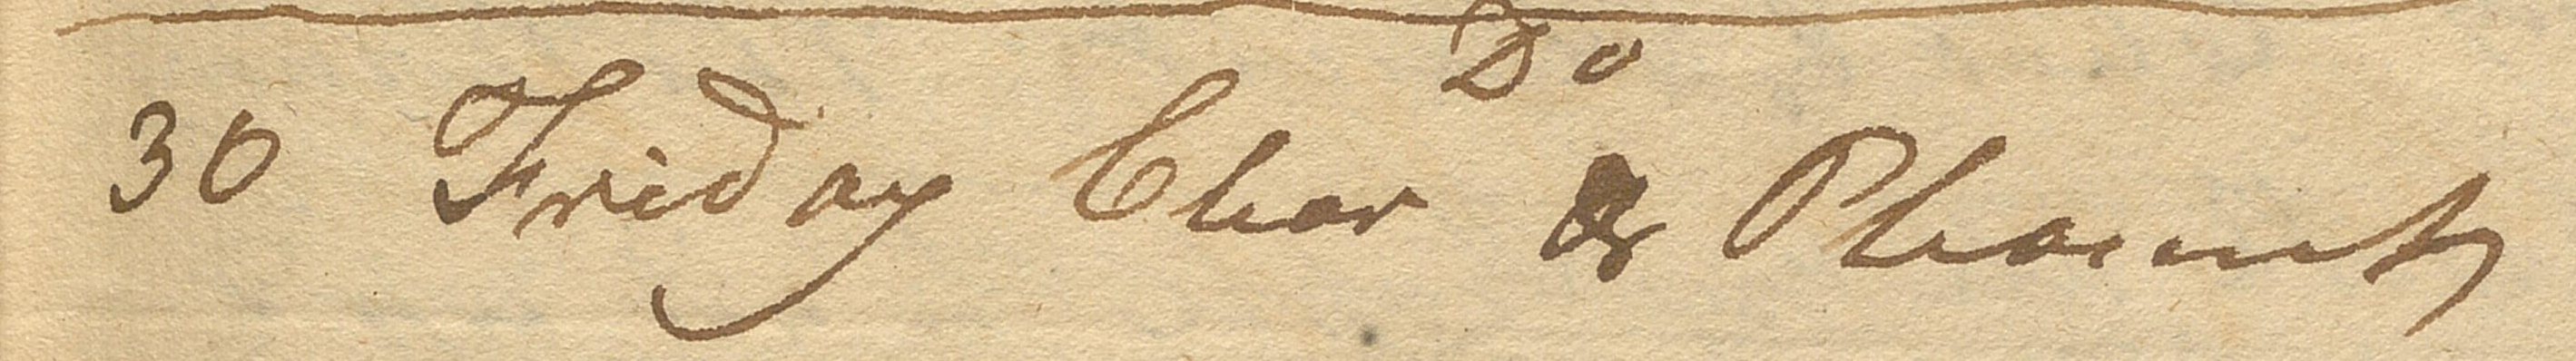30 Friday Clear & Pleasent
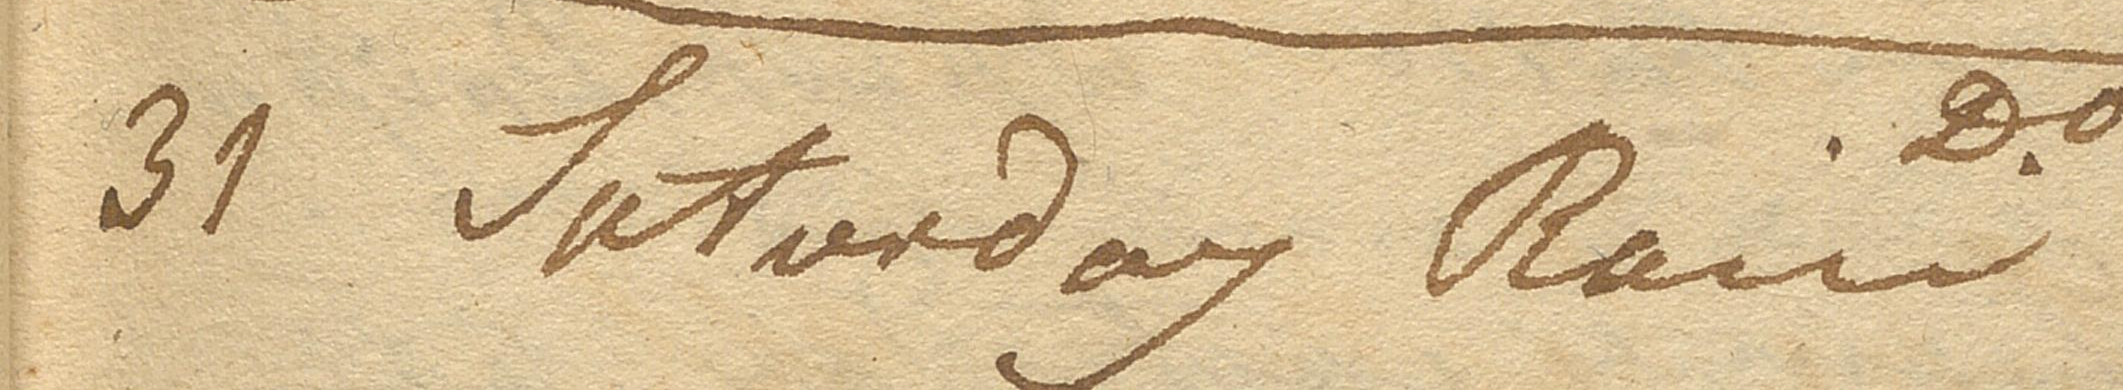31 Saturday Rain
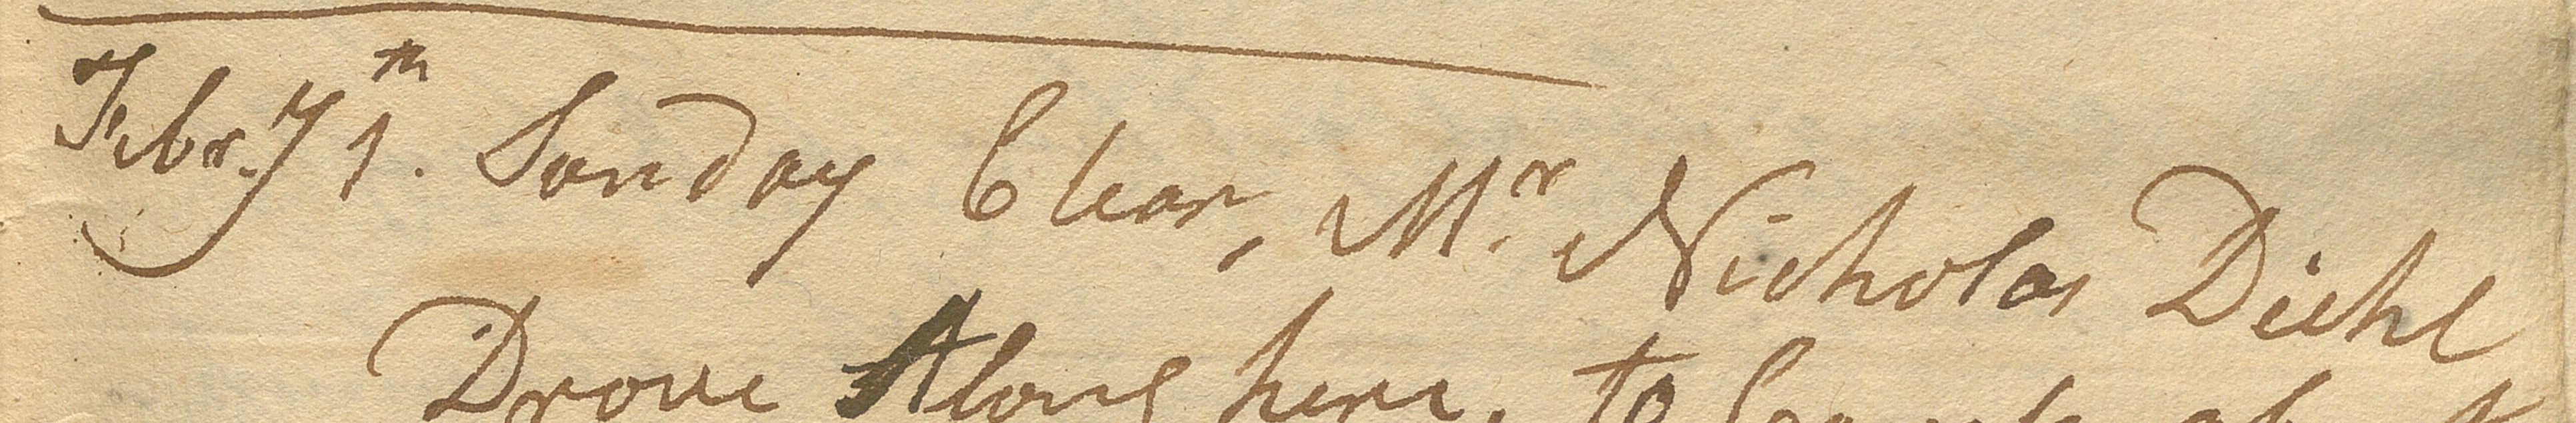Febr^y. 1^th Sunday Clear, M^r. Nicholas Diehl
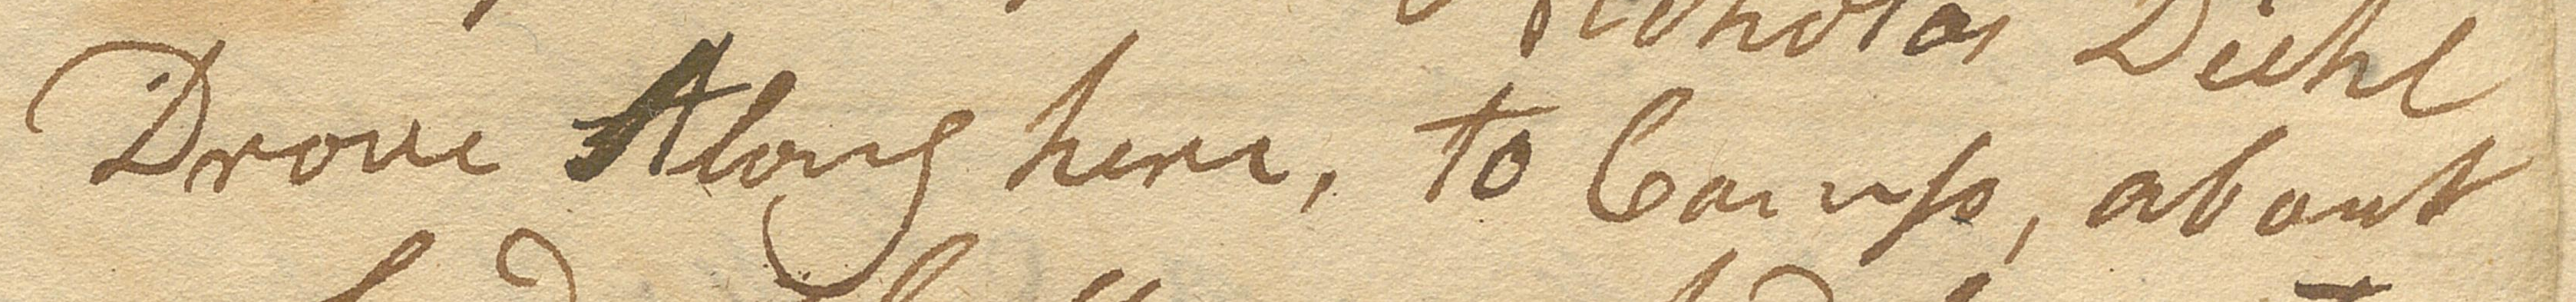Drove Along here, to Camp, about
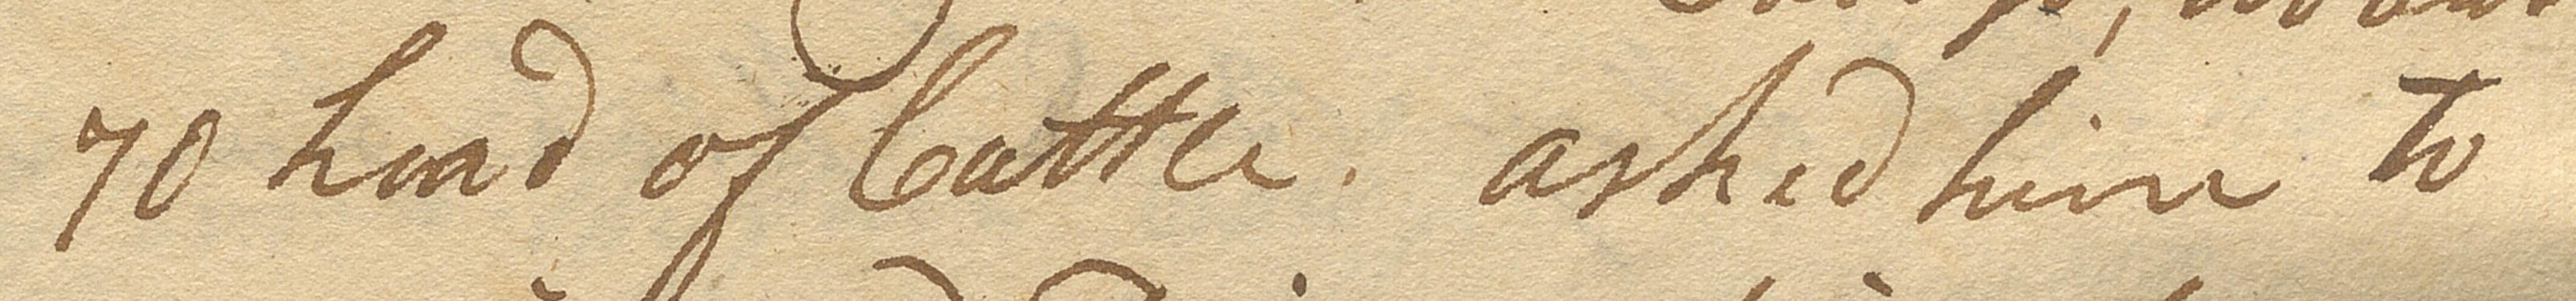70 head of Cattle. asked him to
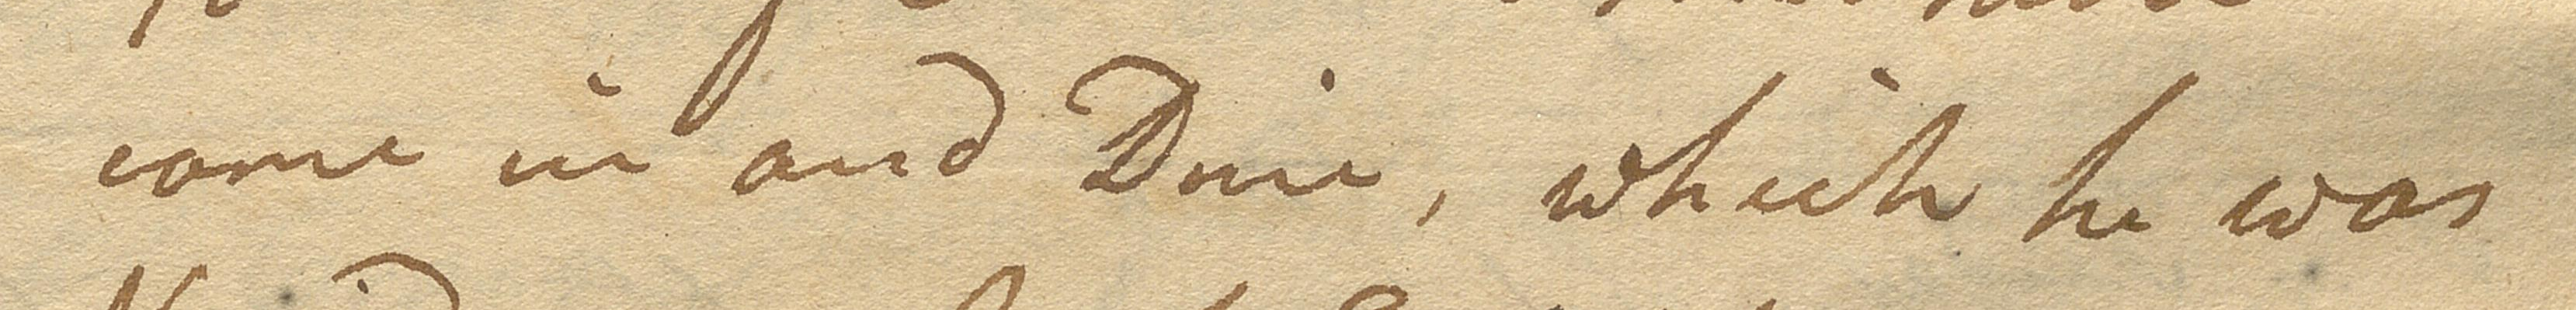come in and Dine, which he was
